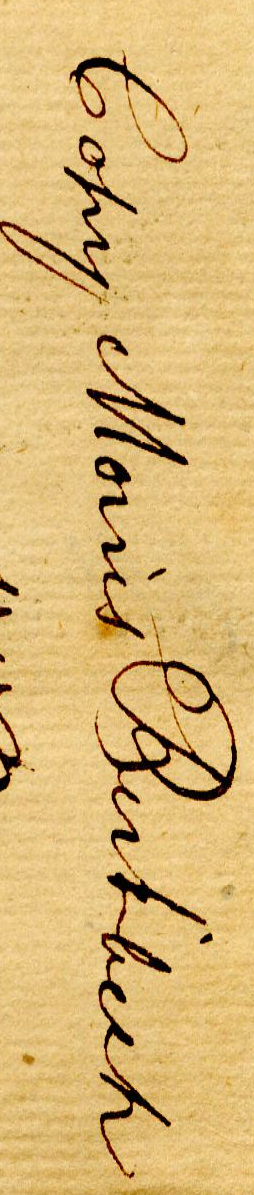Copy Morris Birkbeck
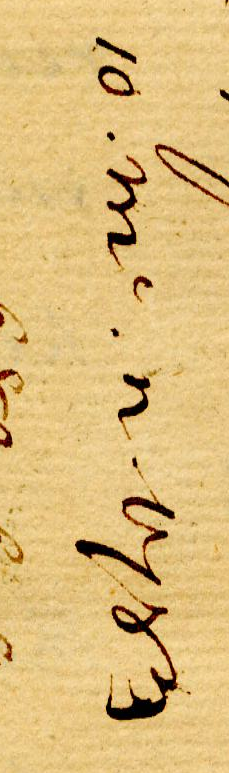10. m^o. 11. 1783
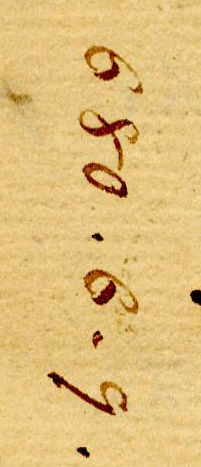680.6.9.
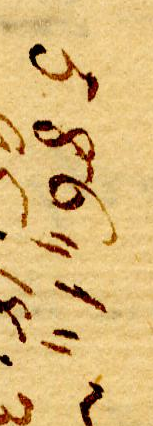586..1..2
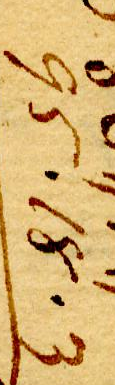95.18.3
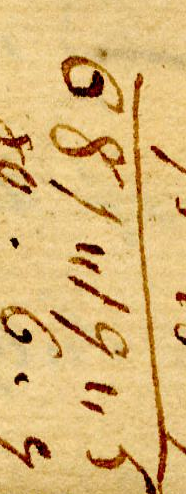681..17..5
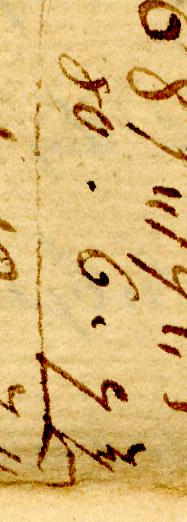80 . 6 .9
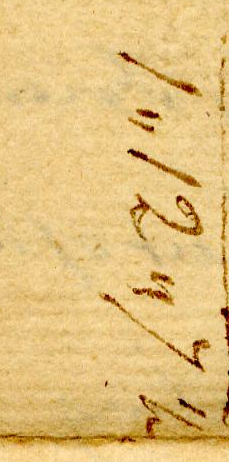1 .. 12 ..7 ..
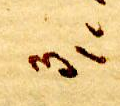3
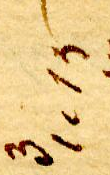1.15
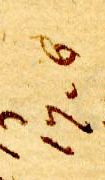17.6
